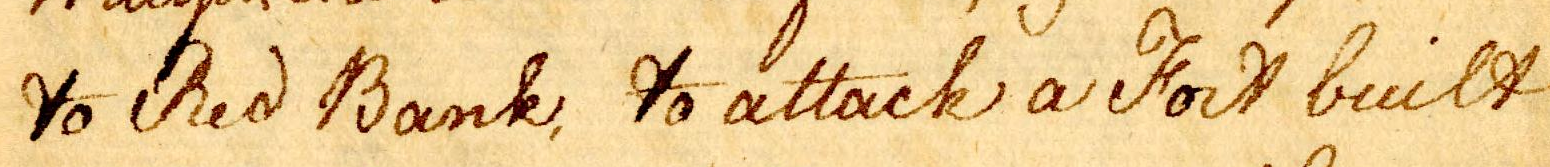to Red Bank, to attack a Fort built
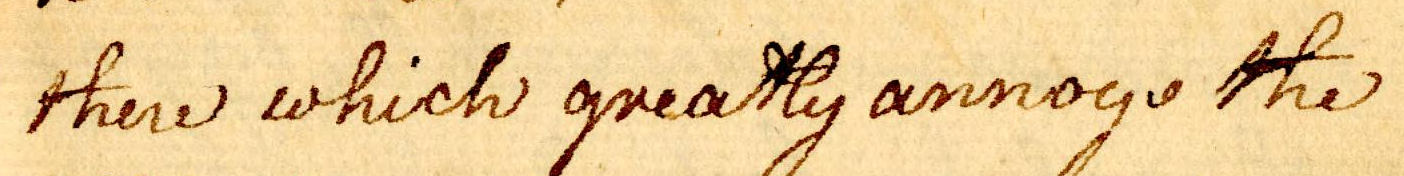there which greatly annoys the
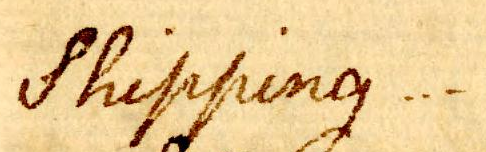Shipping.
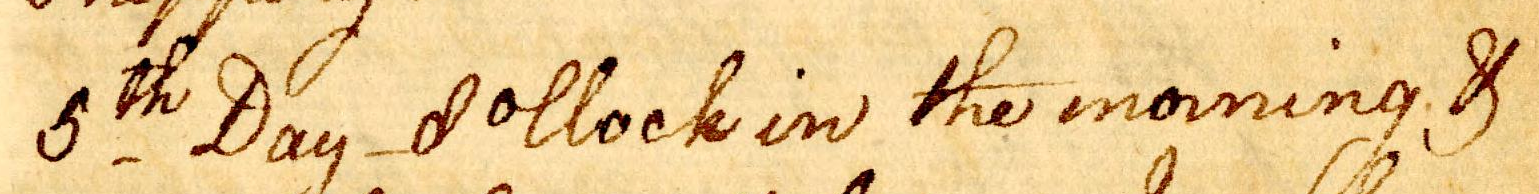5^th Day- 8 ^o Clock in the morning &
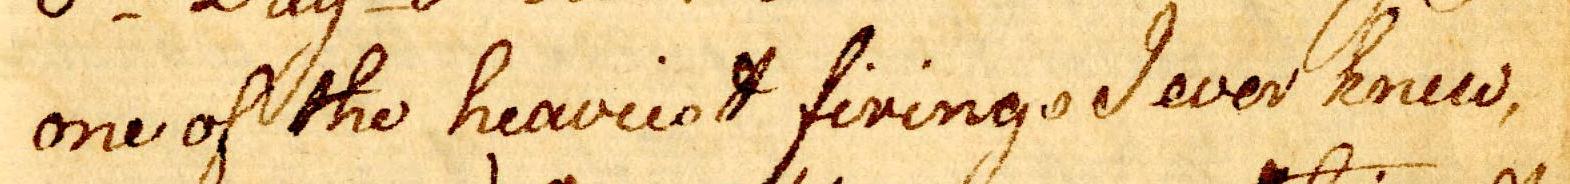one of the heaviest firings I ever knew,
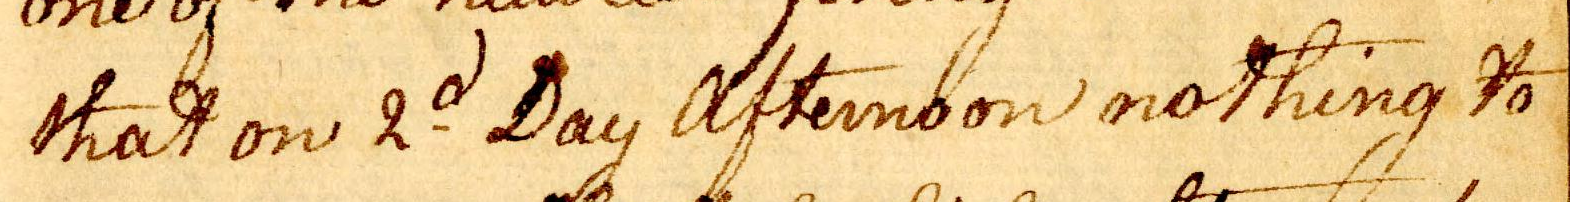that on 2^d Day Afternoon nothing to
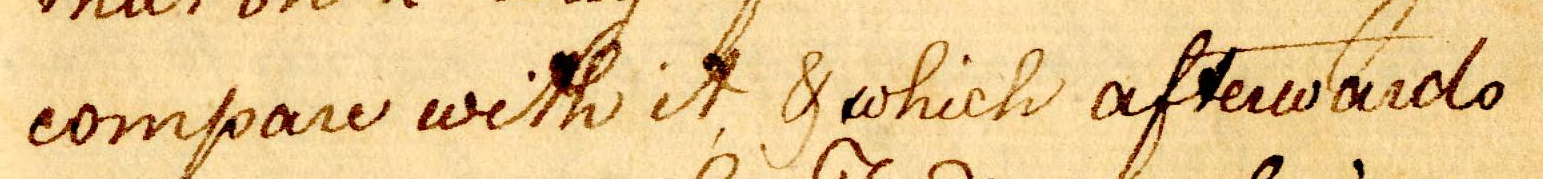compare with it & which afterwards
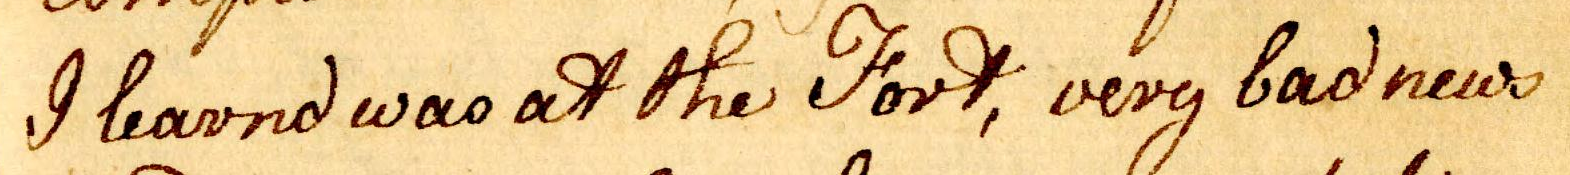I learnd was at the Fort, very bad news
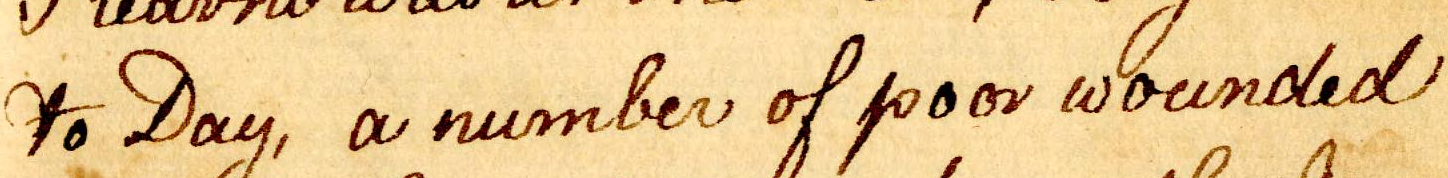to Day, a number of poor wounded
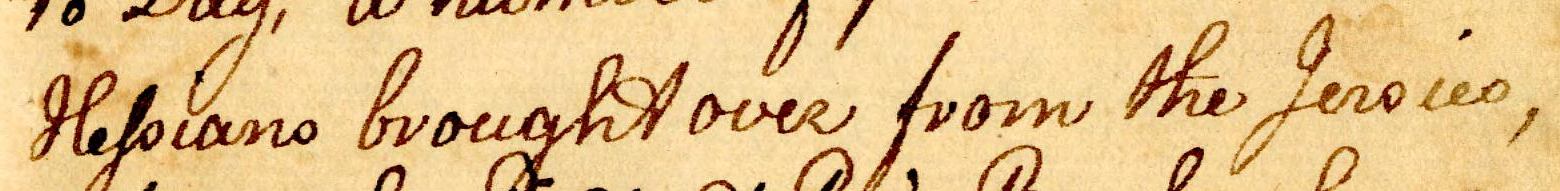Hessians brought over from the Jersies,
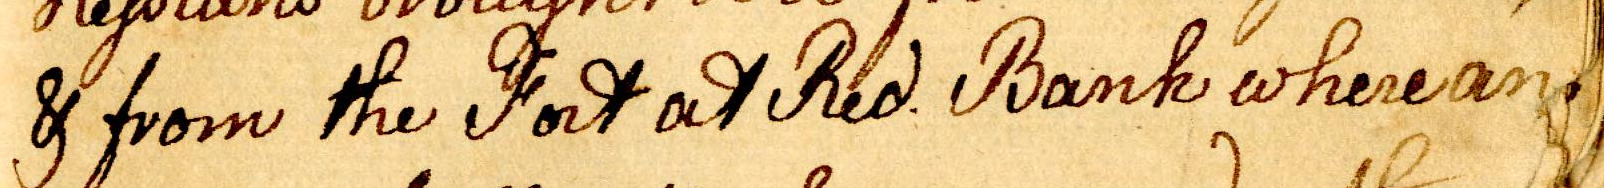& from the Fort at Red. Bank where an
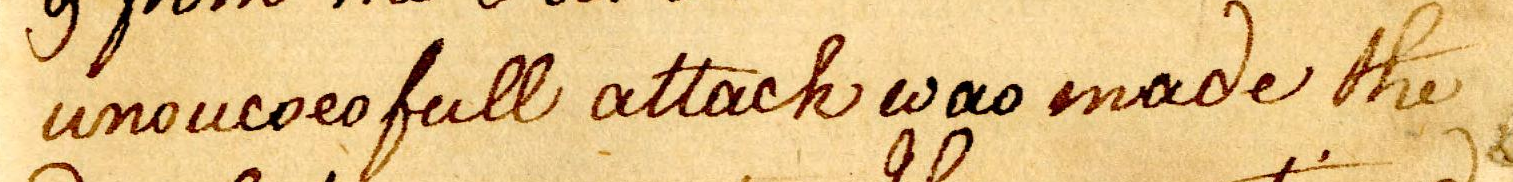unsucsesfull attack was made the
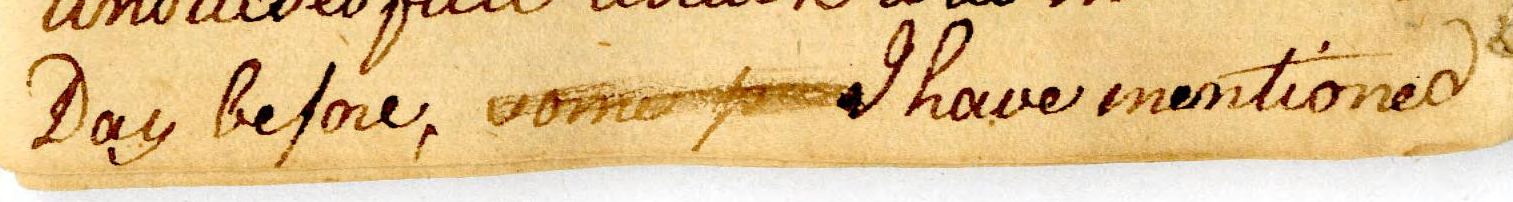Day before, some [p__] I have mentioned
